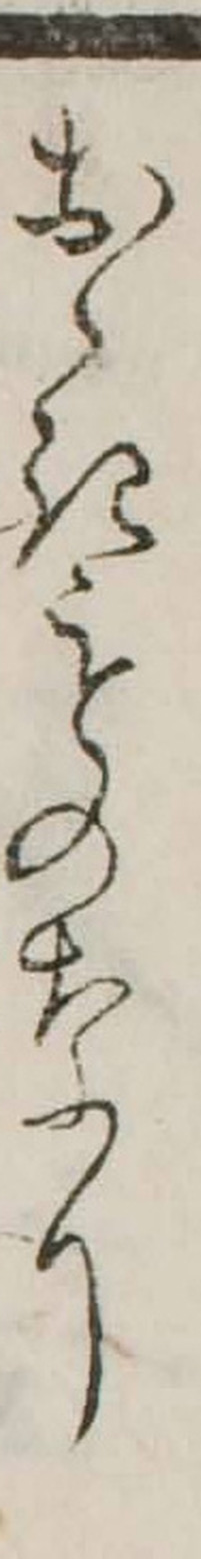おゝきものなり
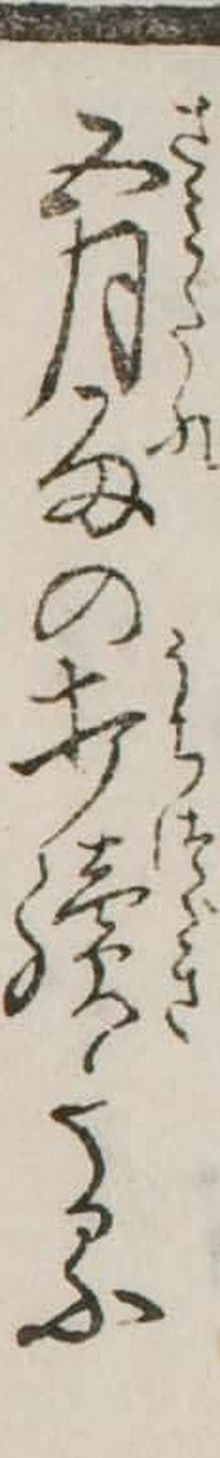五月雨の打続たる
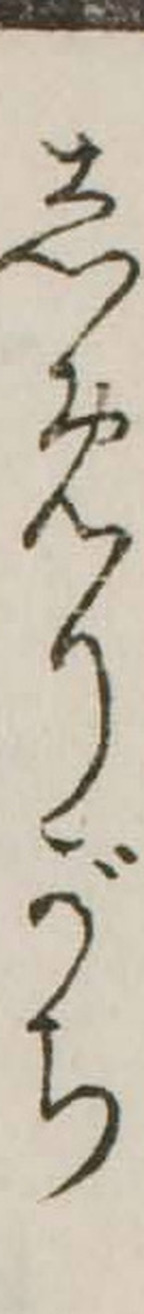しめりがち
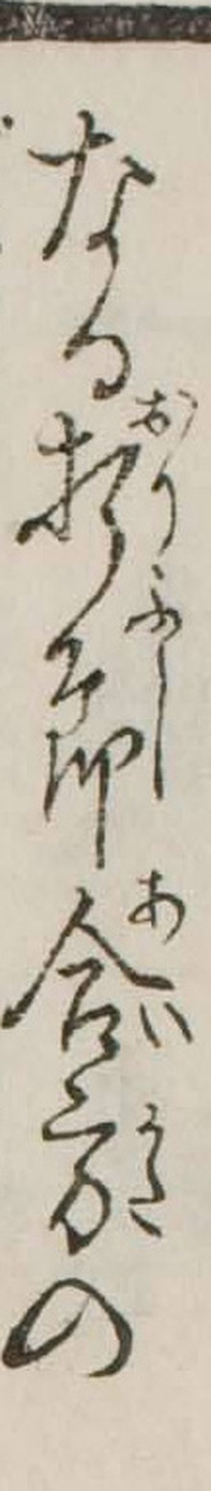なる折節合方の
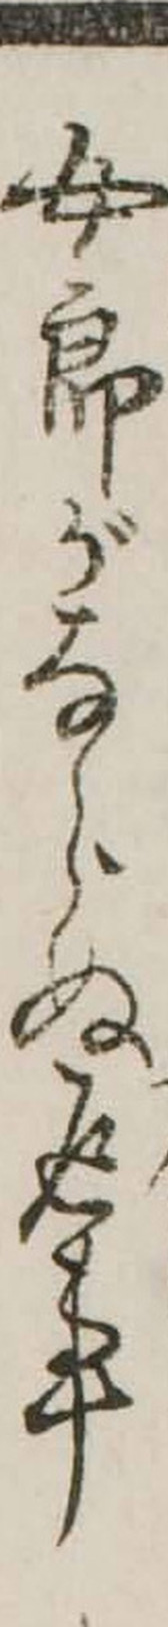女郎がならぬ返事
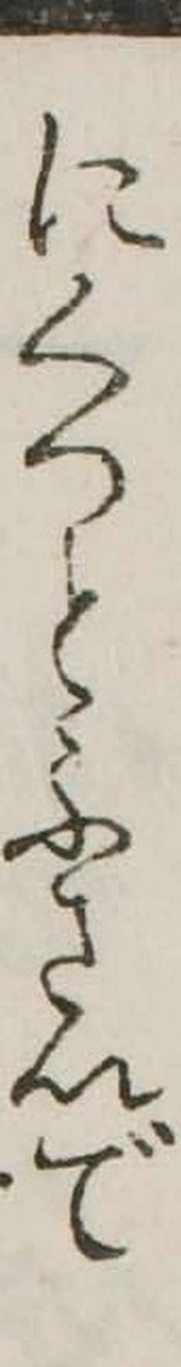にくつとふさいで
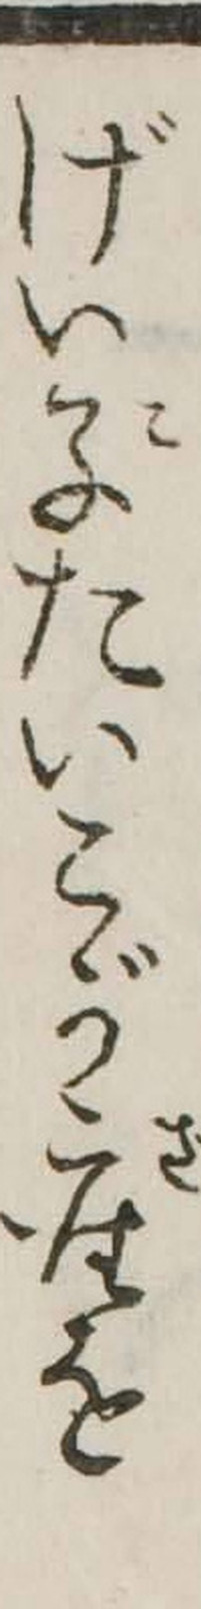げい子たいこが座を
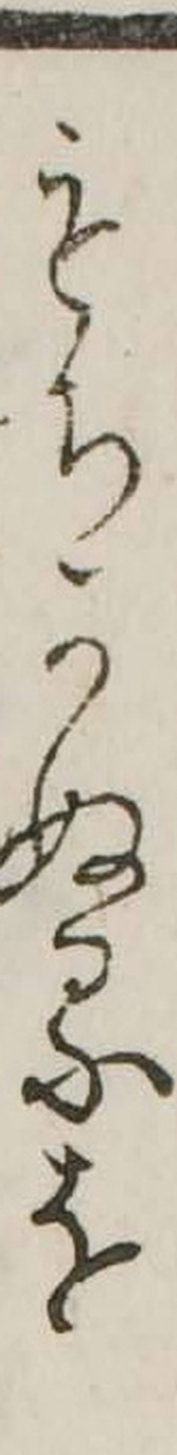もちかぬるを
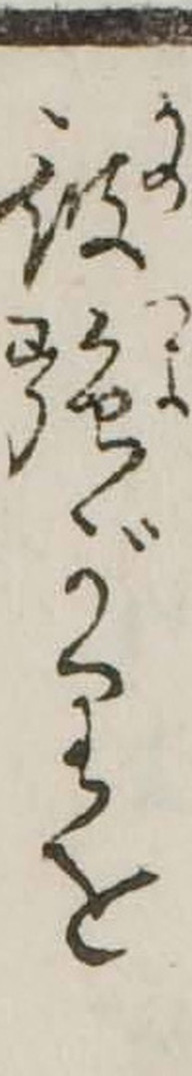彼強がりを
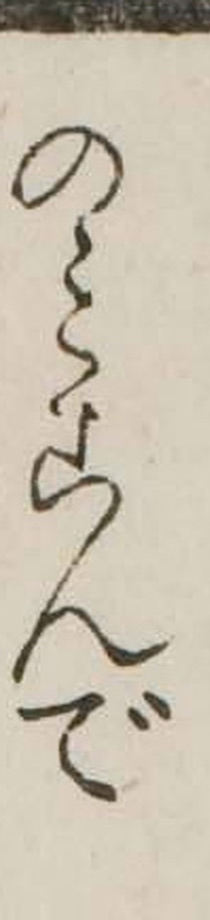のみこんで
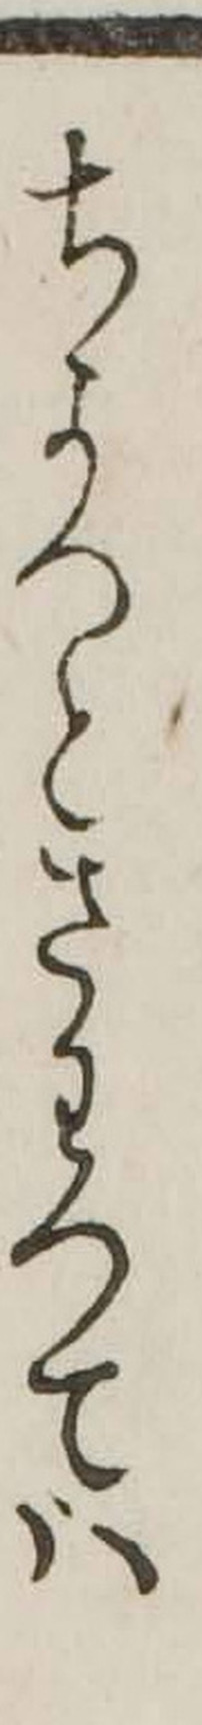ちよつとさわつては
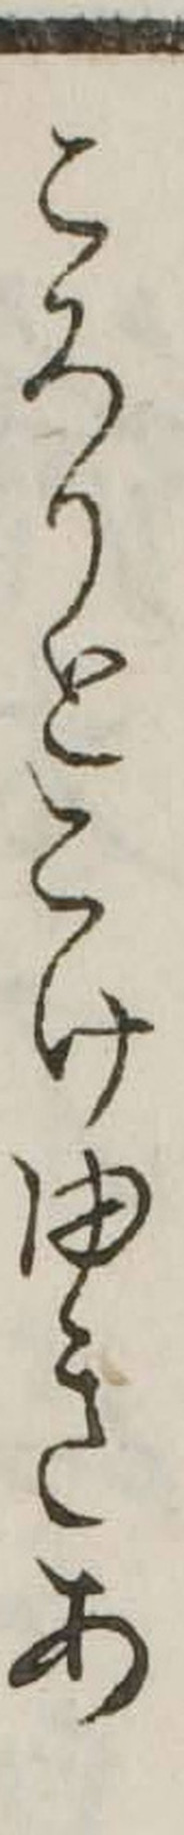ころりとこけゆきあ
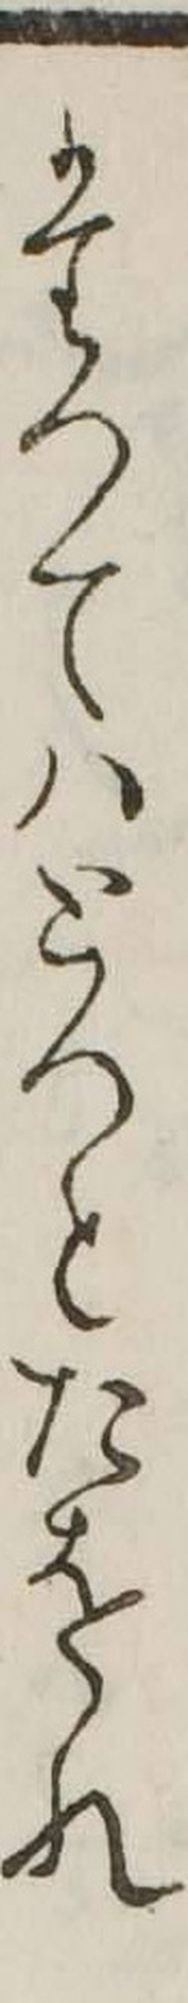たつてはとつとたをれ
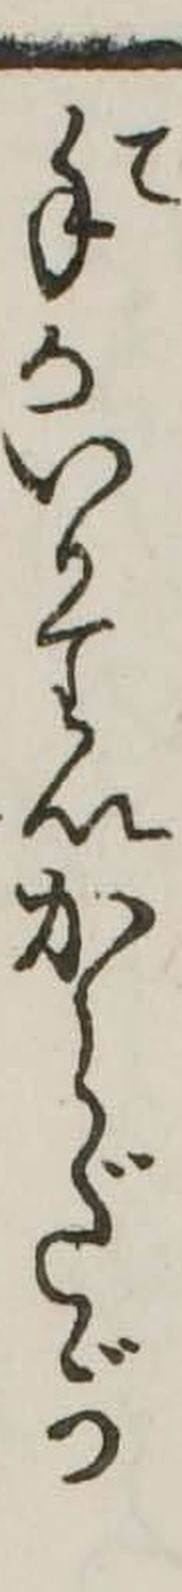手かいたいからだが
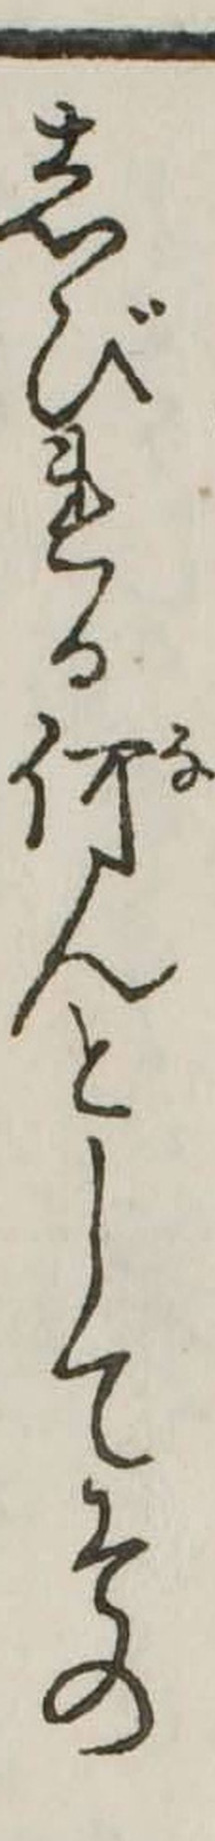しびれる何んとしてその
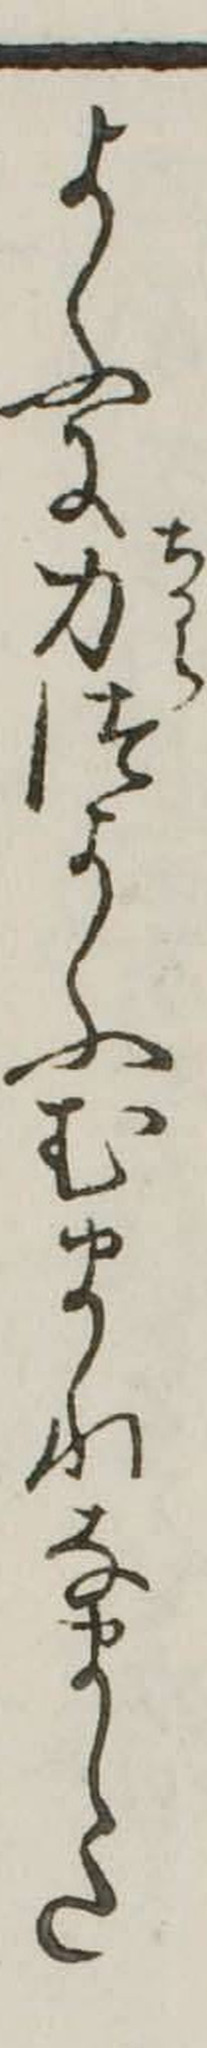よふに力つよふむまれなました
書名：繪本不盡泉
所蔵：国文学研究資料館
